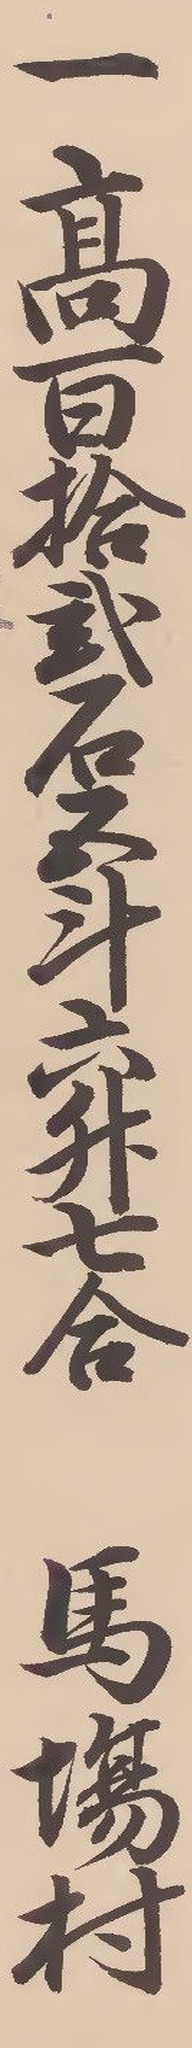一高百拾弐石五斗六升七合馬場村

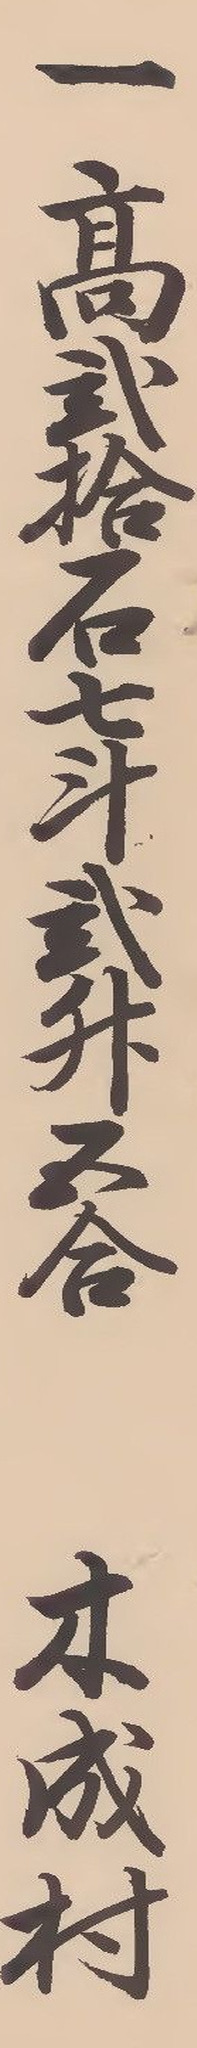一高弐拾石七斗弐升五合木成村
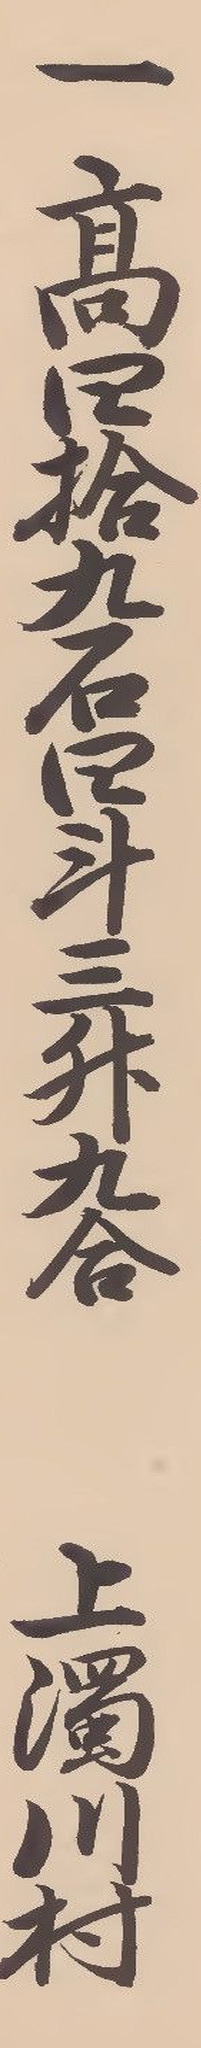一高四拾九石四斗三升九合上濁川村
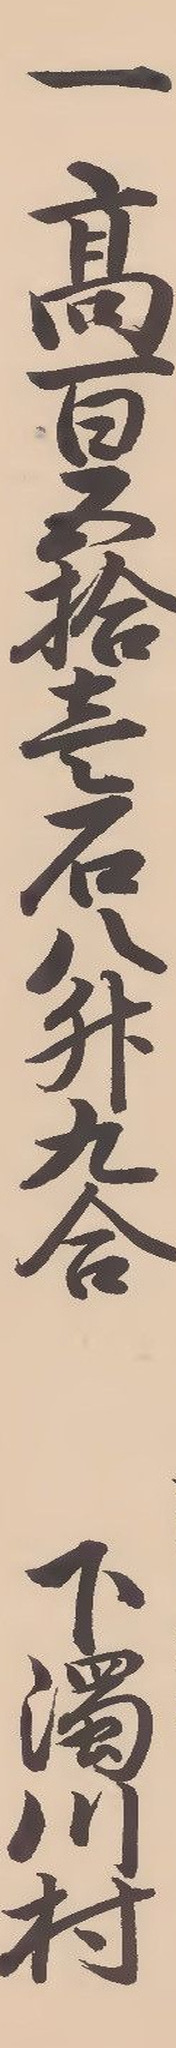一高百五拾壱石八升九合下濁川村
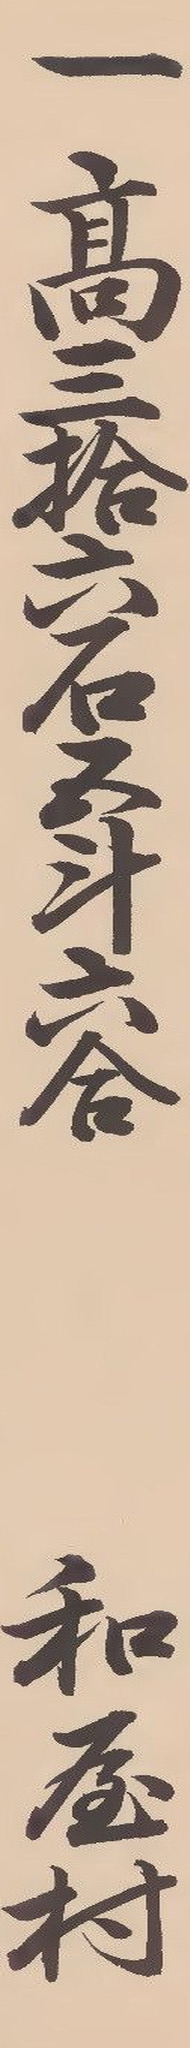一高三拾六石五斗六合和屋村
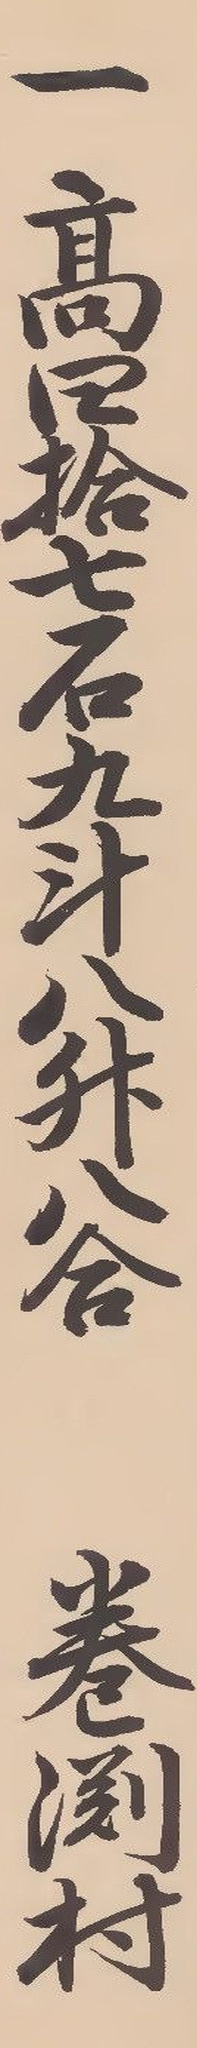一高四拾七石九斗八升八合巻淵村
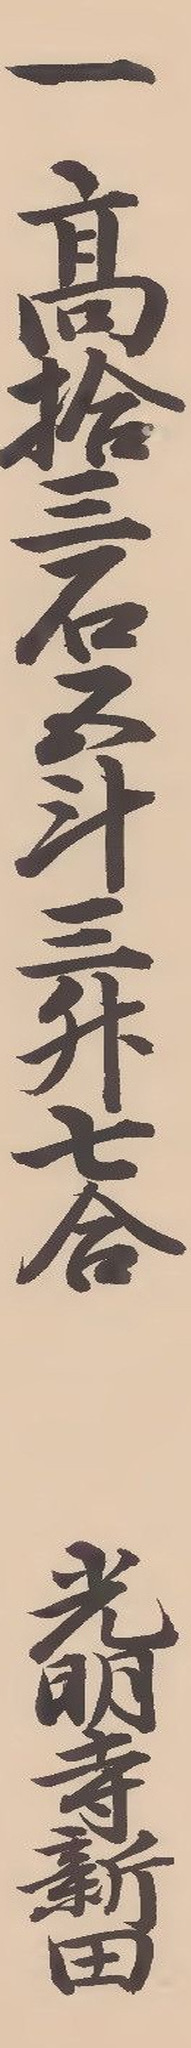一高拾三石五斗三升七合光明寺新田
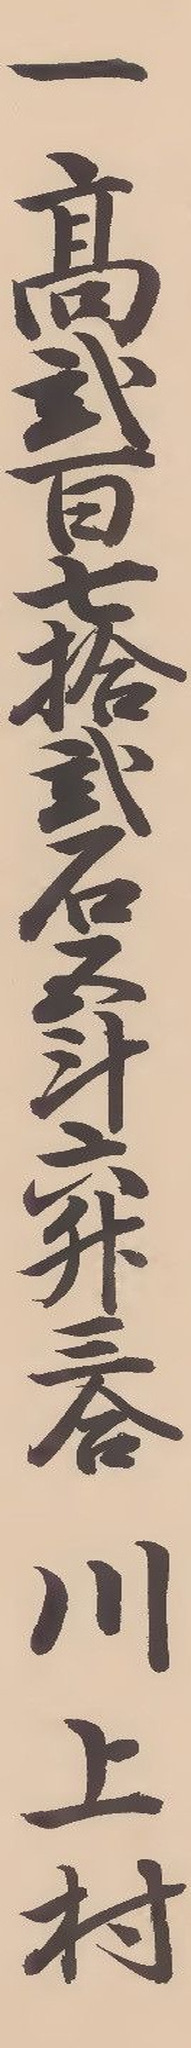一高弐百七拾弐石五斗六升三合川上村
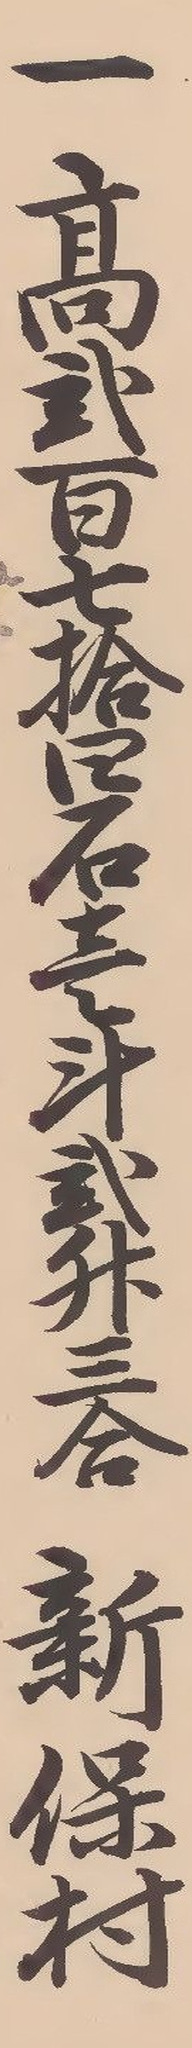一高弐百七拾四石壱斗弐升三合新保村

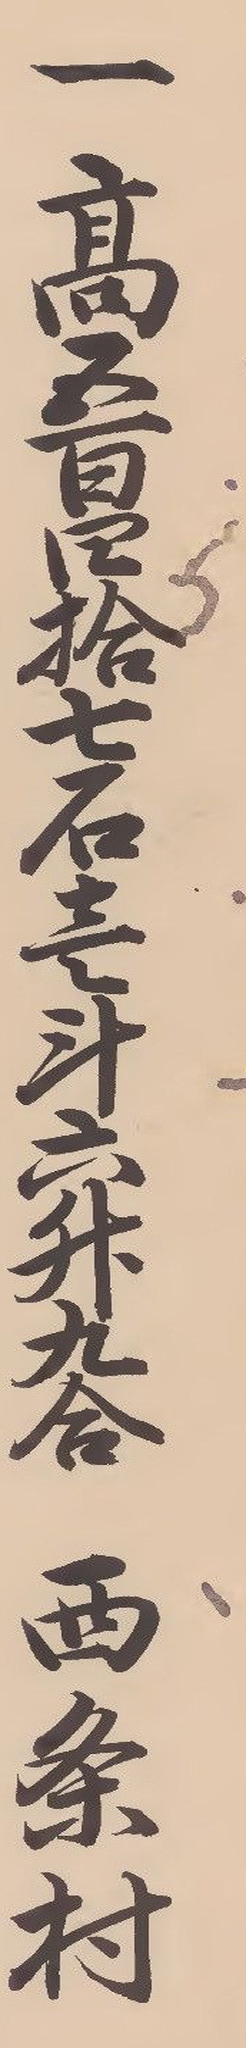一高五百四拾七石壱斗六升九合西条村
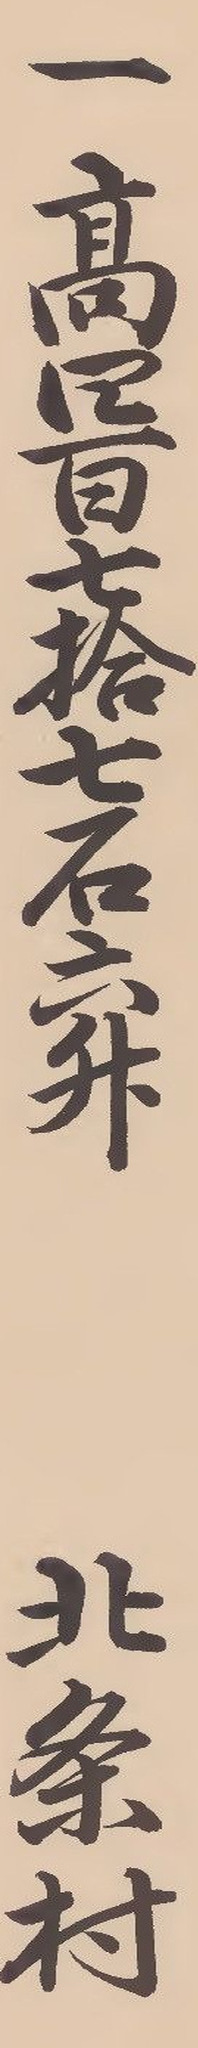一高四百七拾七石六升北条村
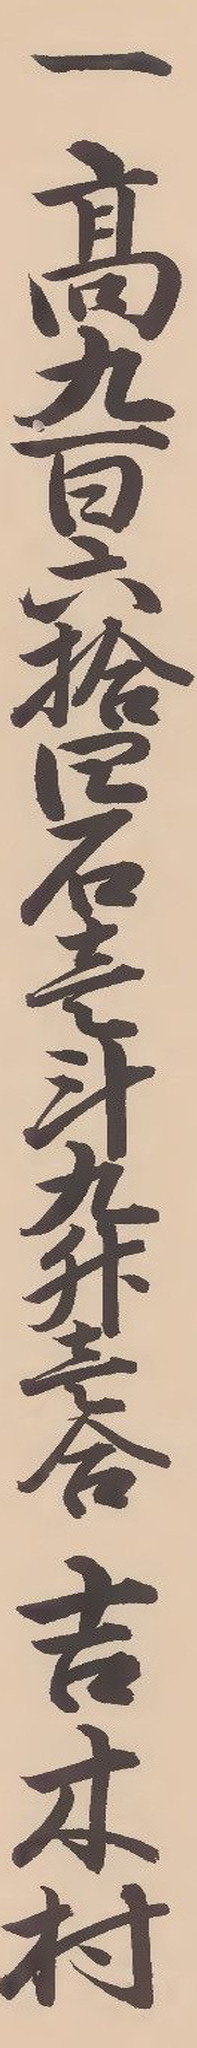一高九百六拾四石壱斗九升壱合吉木村
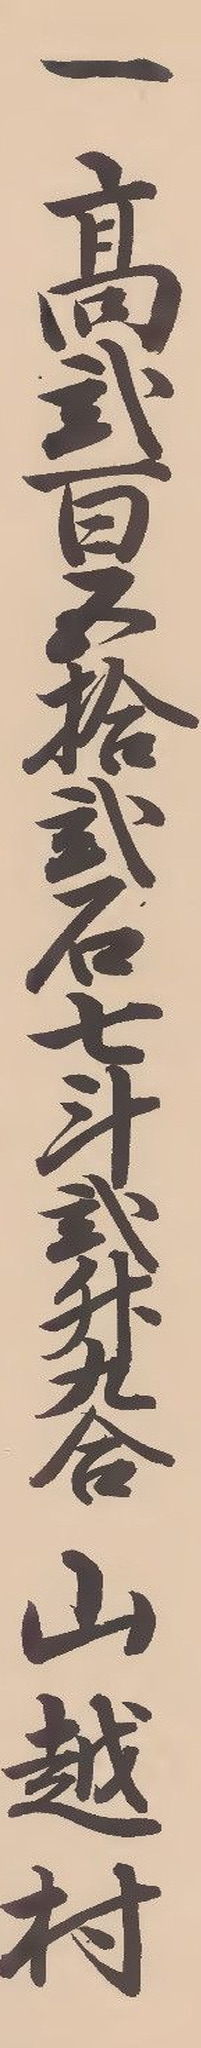一高弐百五拾弐石七斗弐升九合山越村
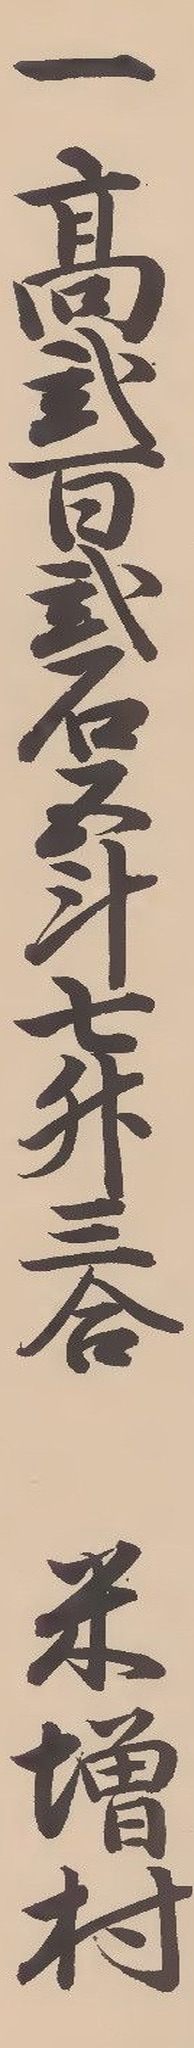一高弐百弐石五斗七升三合米増村
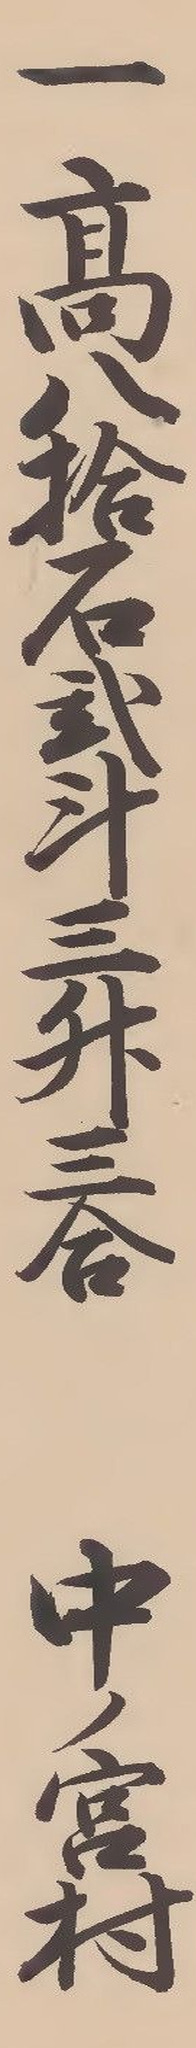一高八拾石弐斗三升三合中ノ宮村
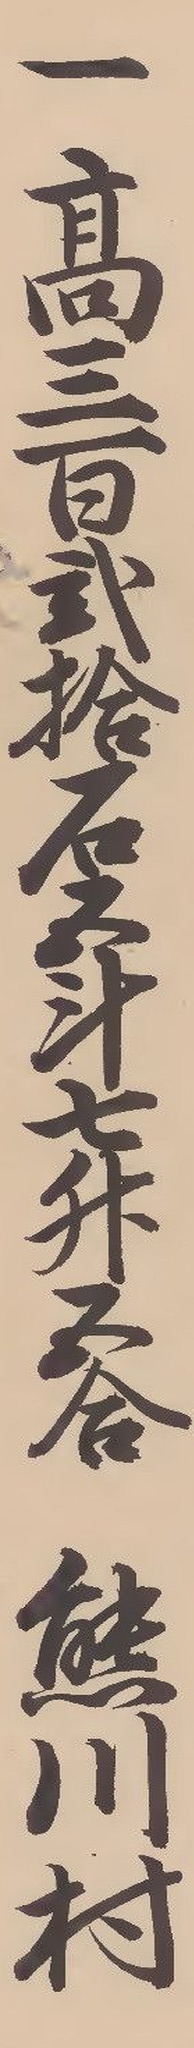一高三百弐拾石五斗七升五合熊川村
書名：越後国郷帳　上
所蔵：国立公文書館 National Archives of Japan
